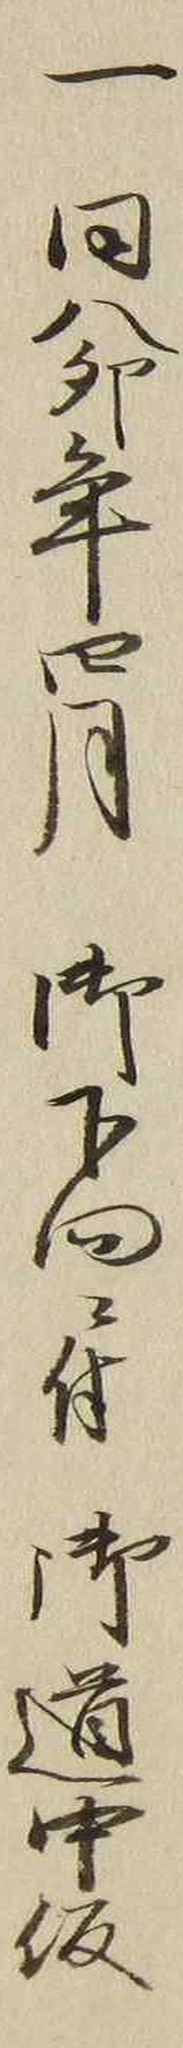一同八夘年四月御下向ニ付御道中仮
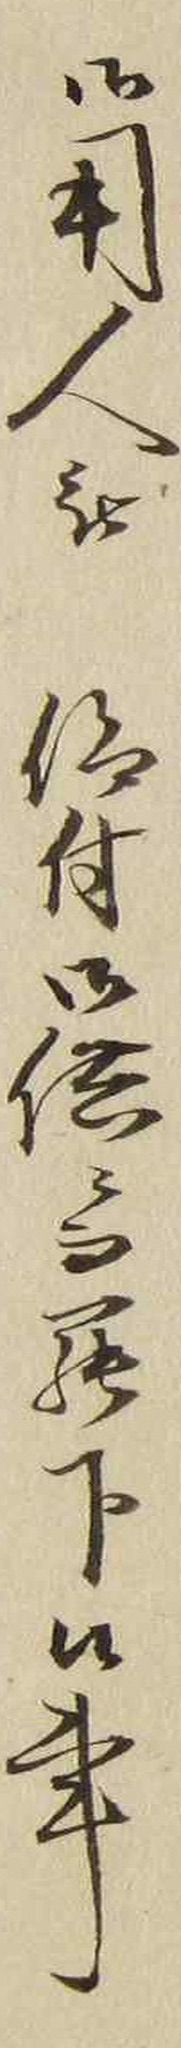御用人被仰付御供ニ而罷下候事

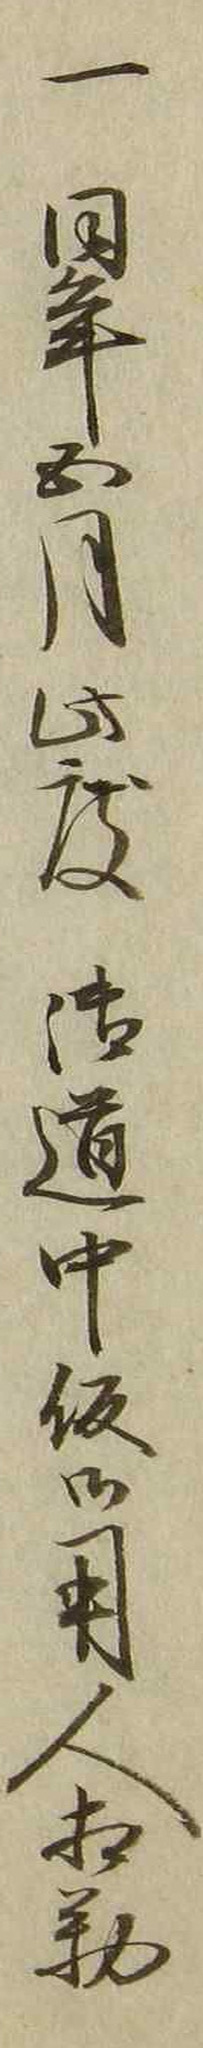一同年五月此度御道中仮御用人相勤
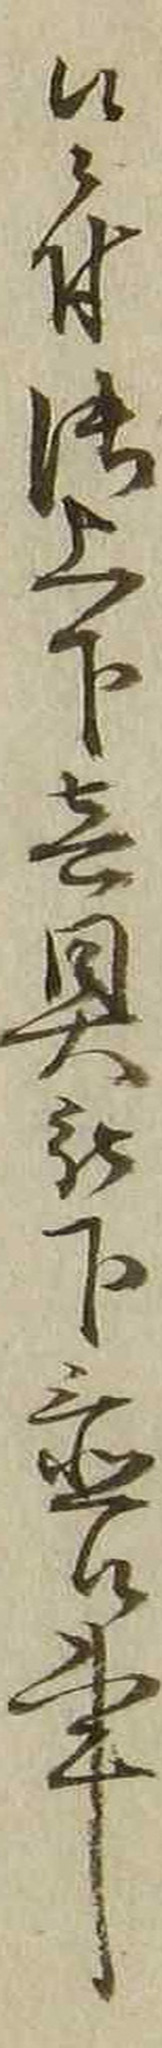候ニ付御上下壱具被下置候事
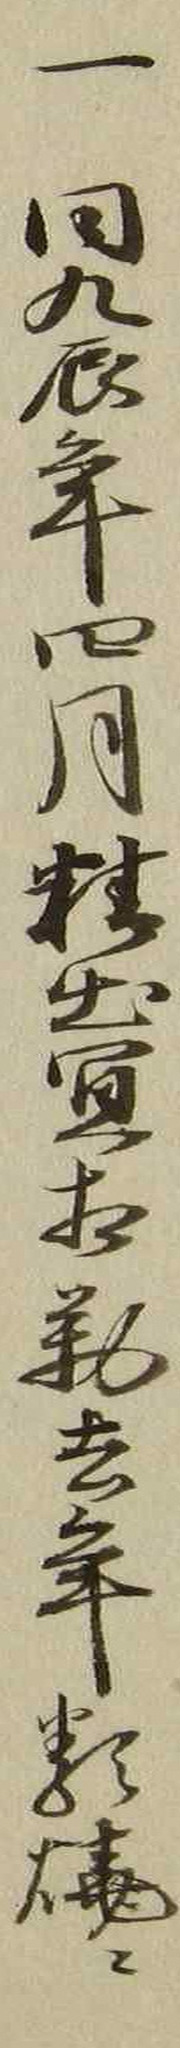一同九辰年四月精出宣相勤去年類焼ニ
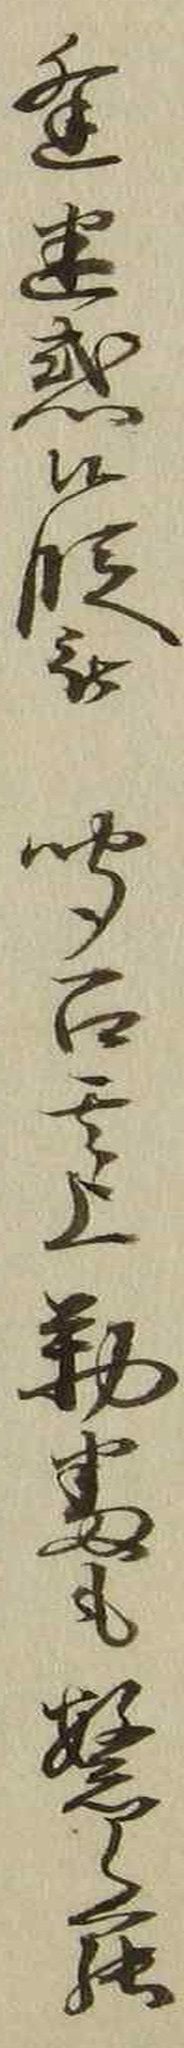逢迷惑候段被聞召其上勤番も繁し罷
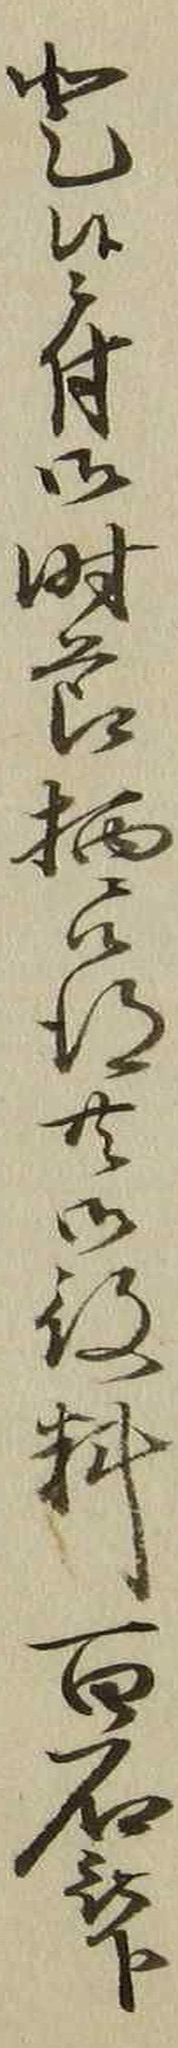登候ニ付御時節柄ニ候得共御役料百石被下
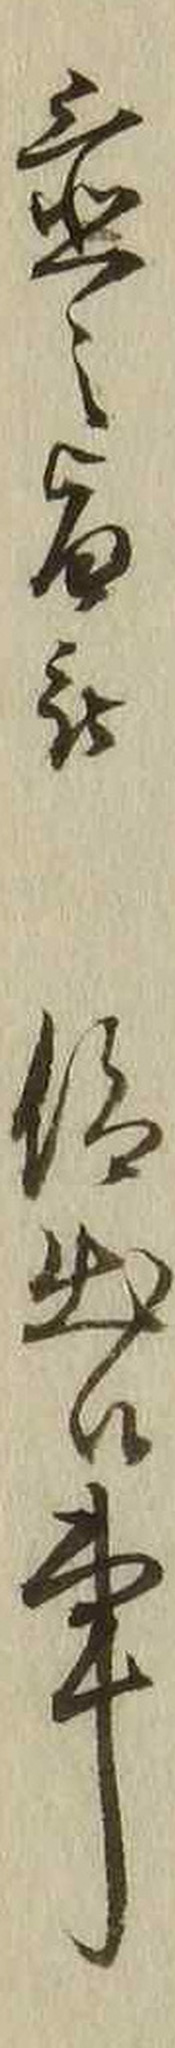置之旨被仰出候事
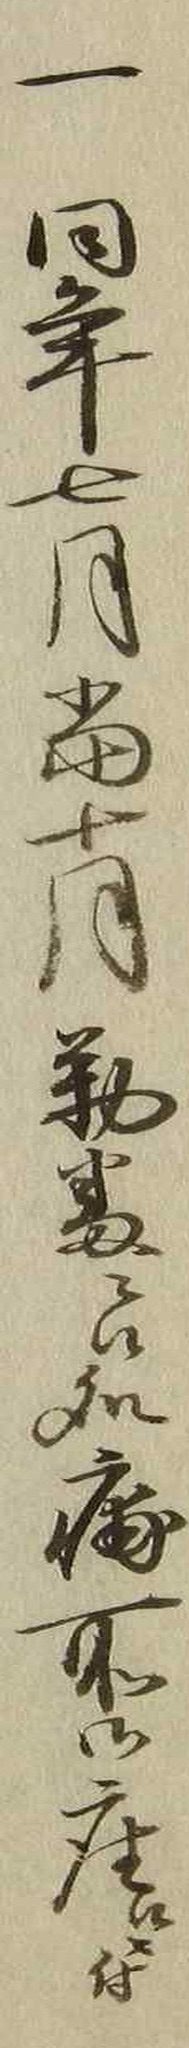一同年七月当十月勤番ニ候処痛所御座候二付
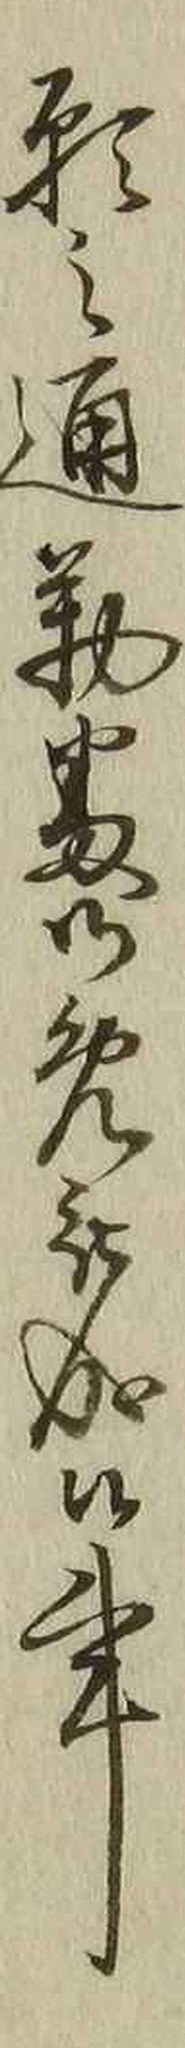願之通勤番御免被成候事
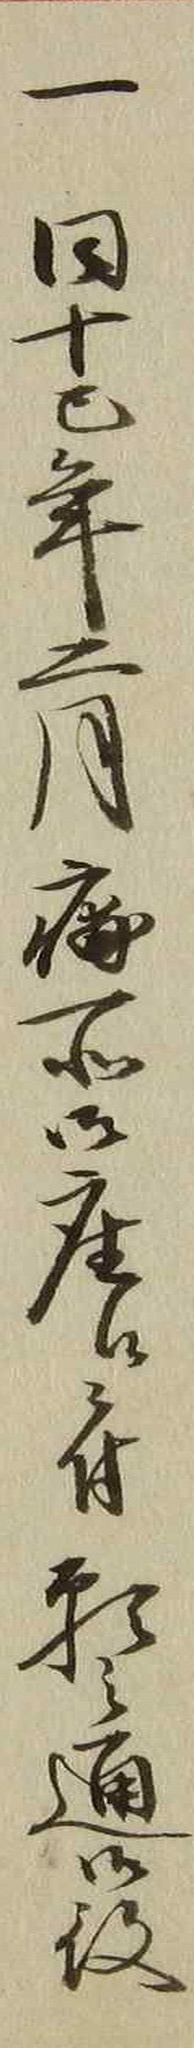一同十巳年二月痛所御座候二付願之通御役
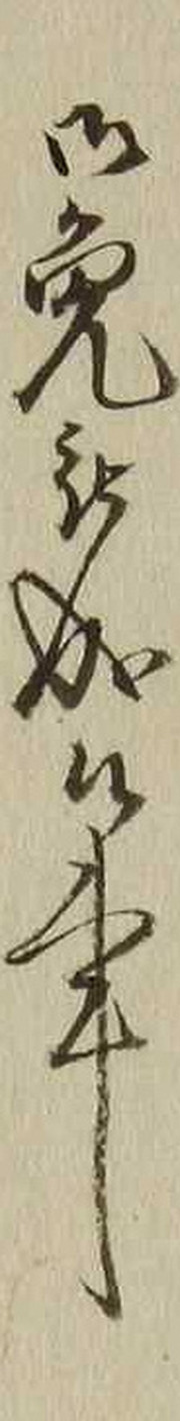御免被成候事
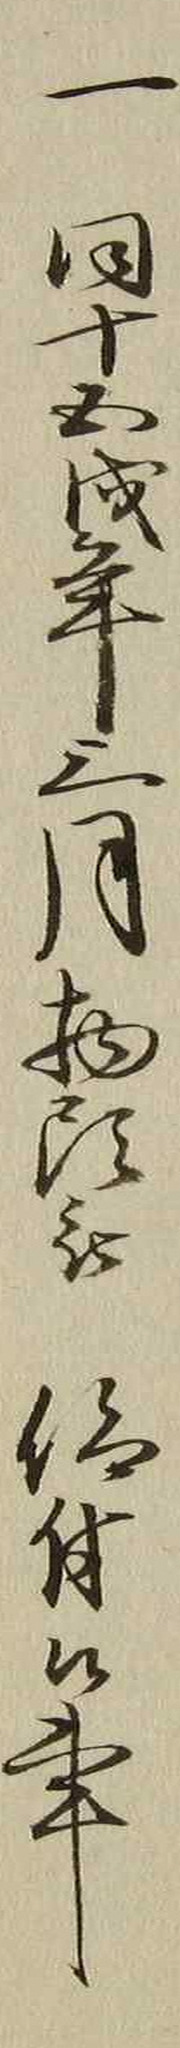一同十五戌年三月物頭被仰付候事
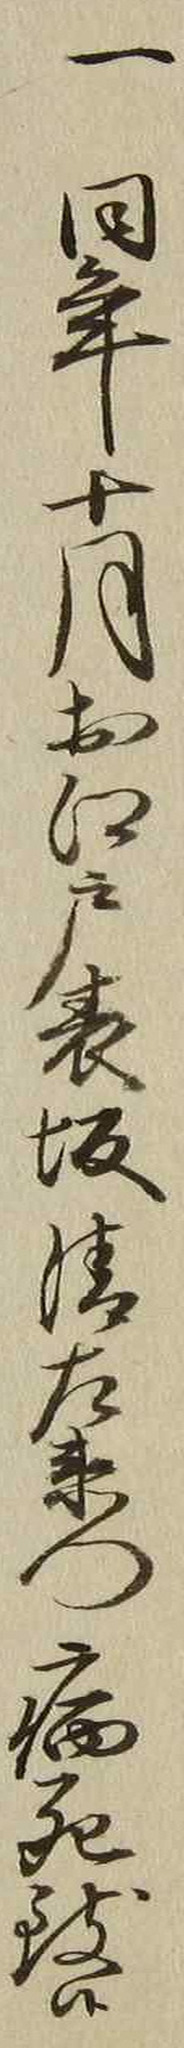一同年十月お江戸表坂清左衛門病死致候
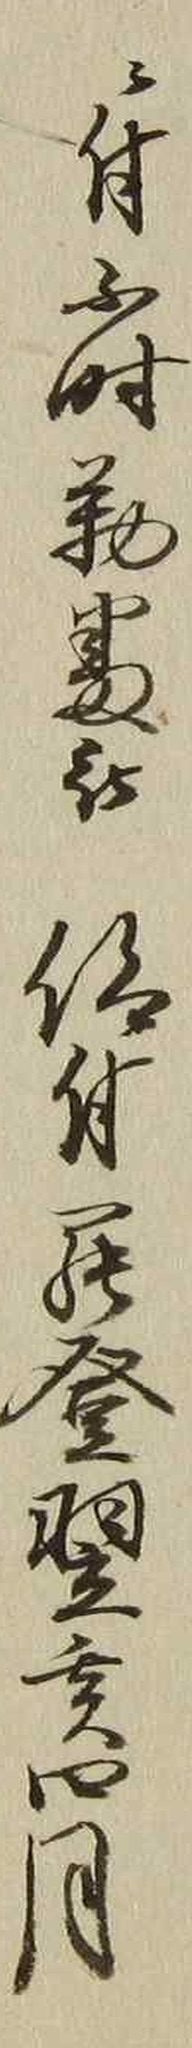二付ふ時勤番被仰付罷登翌亥四月
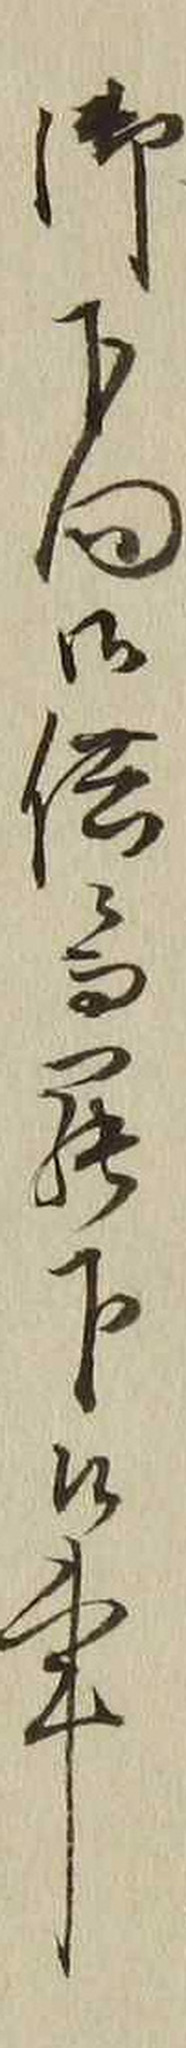御下向御供ニ而罷下候事
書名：諸士系譜　巻之114　か之部22
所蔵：会津若松市立会津図書館
